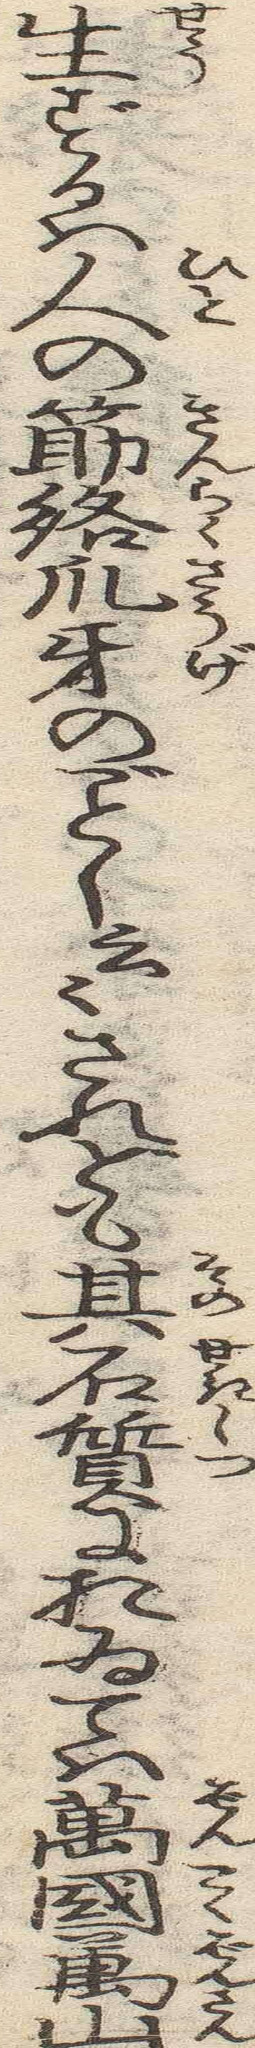生ずるは人の筋絡爪牙のごとし云々されども其石質におゐては万国万山
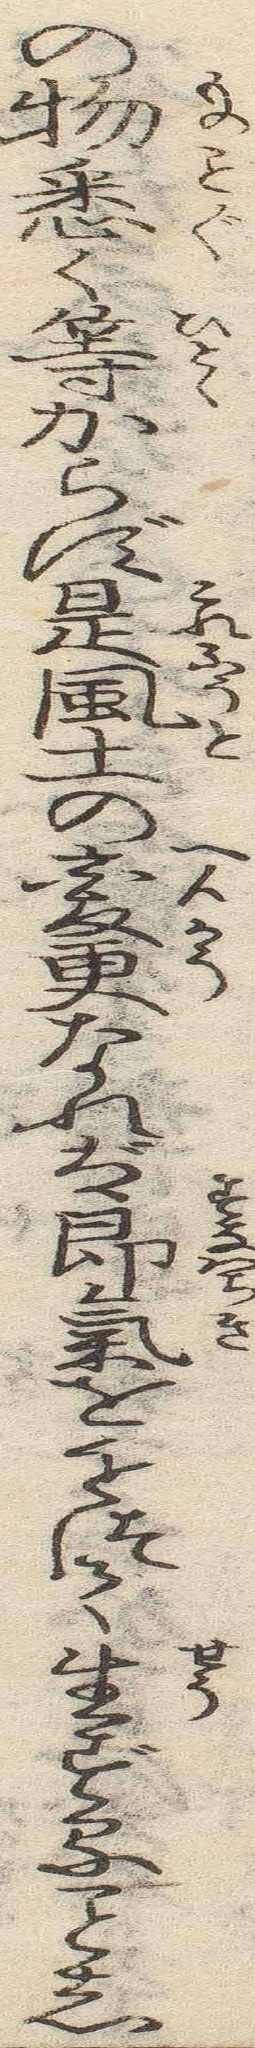の物悉く等からず是風土の変更なれば即気をもつて生ずることし
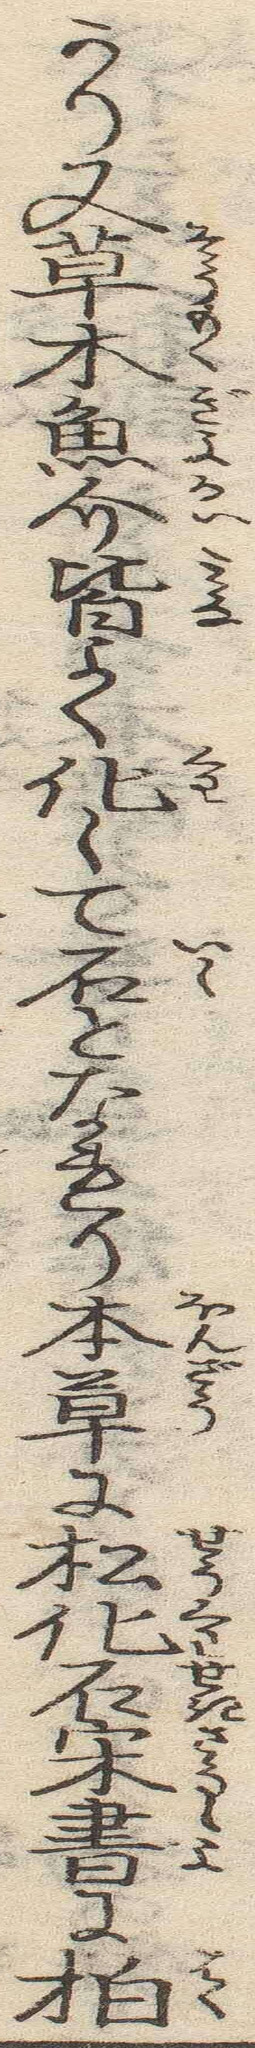かり又草木魚介皆よく化して石となれり本草に松化石宋書に柏
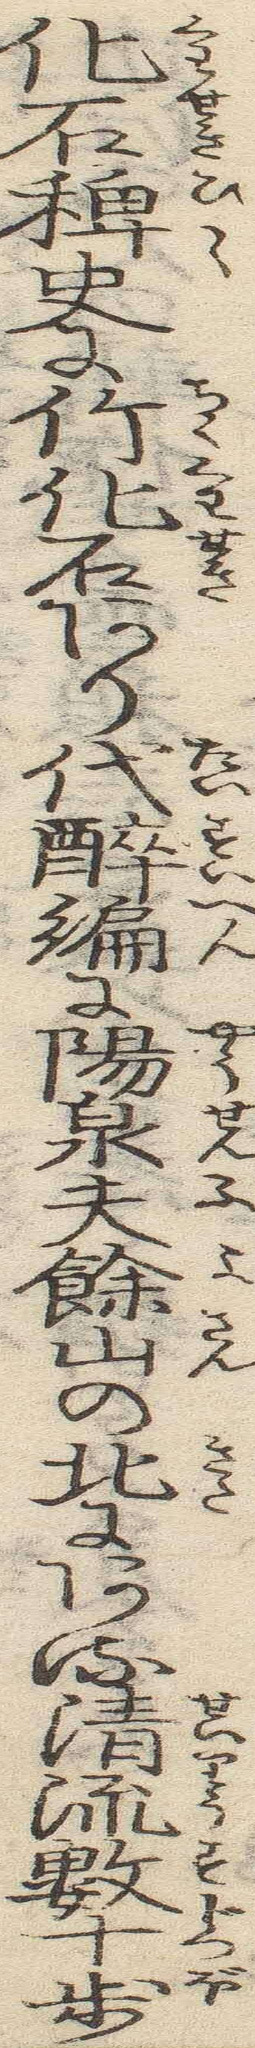化石稗史に竹化石あり代酔編に陽泉夫余山の北にある清流数十歩
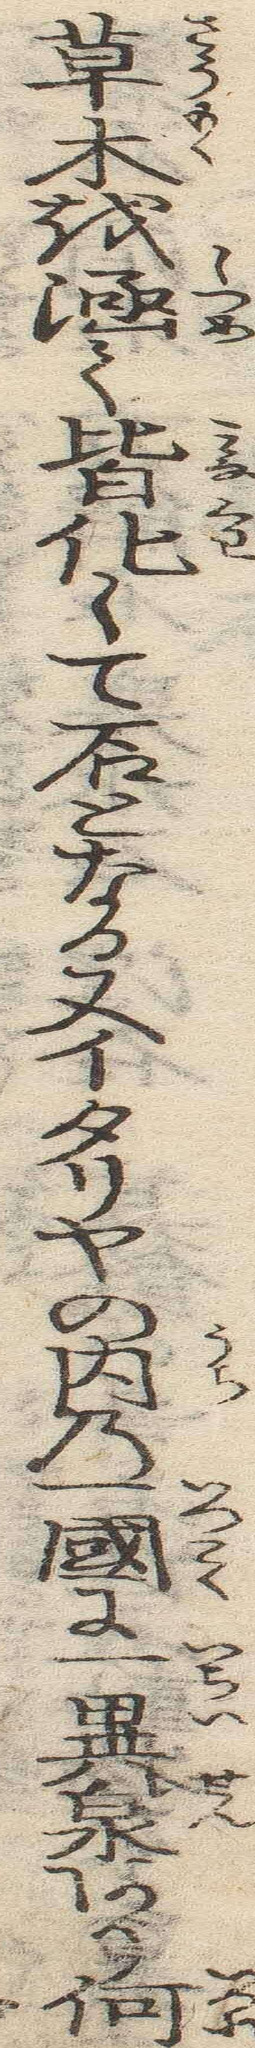草木を涵て皆化して石となる又イタリヤの内の一国に一異泉あり何
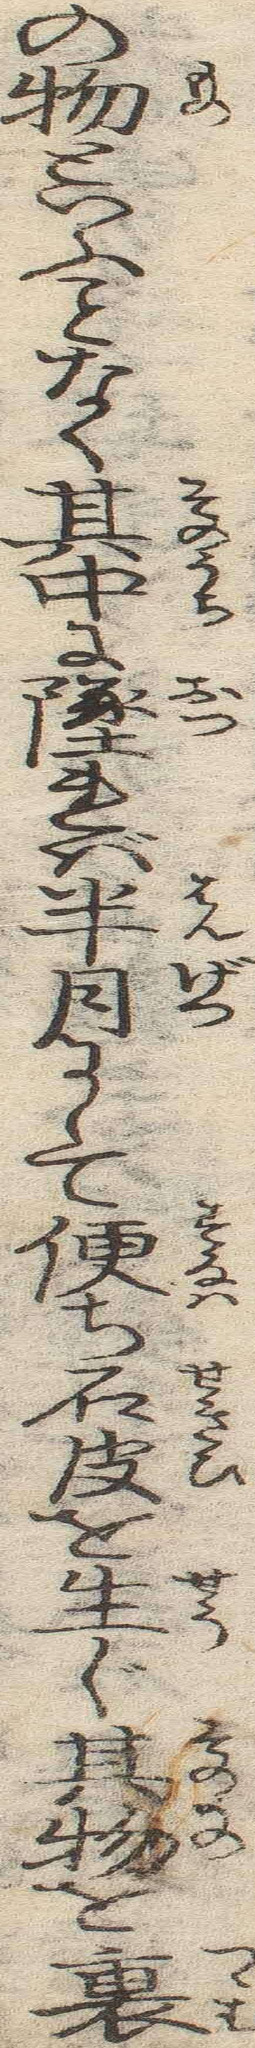の物といふことなく其中に墜れば半月にして便ち石皮を生じ其物を裏
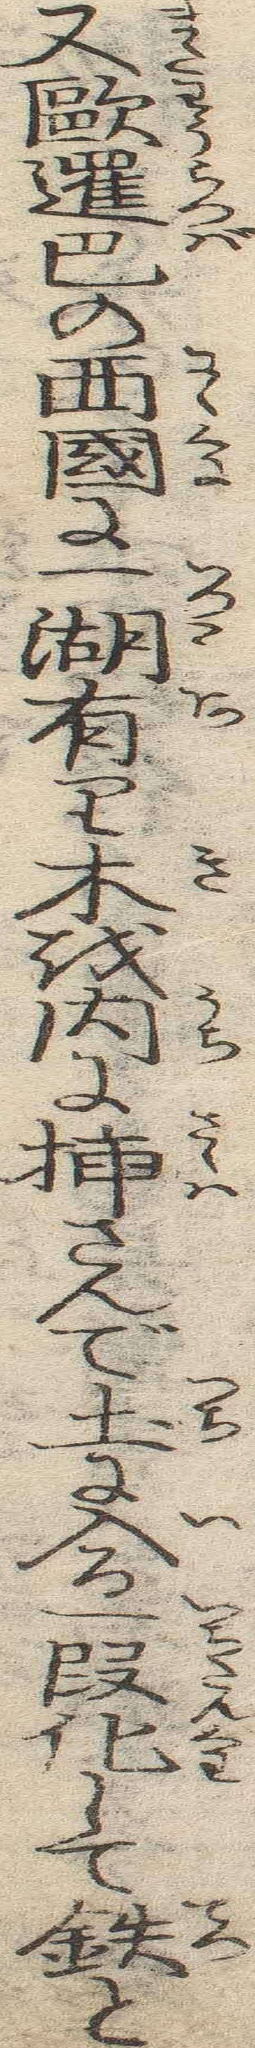又欧𨗴巴の西国に一湖有り木を内に挿さんで土に入る一叚化して鉄と
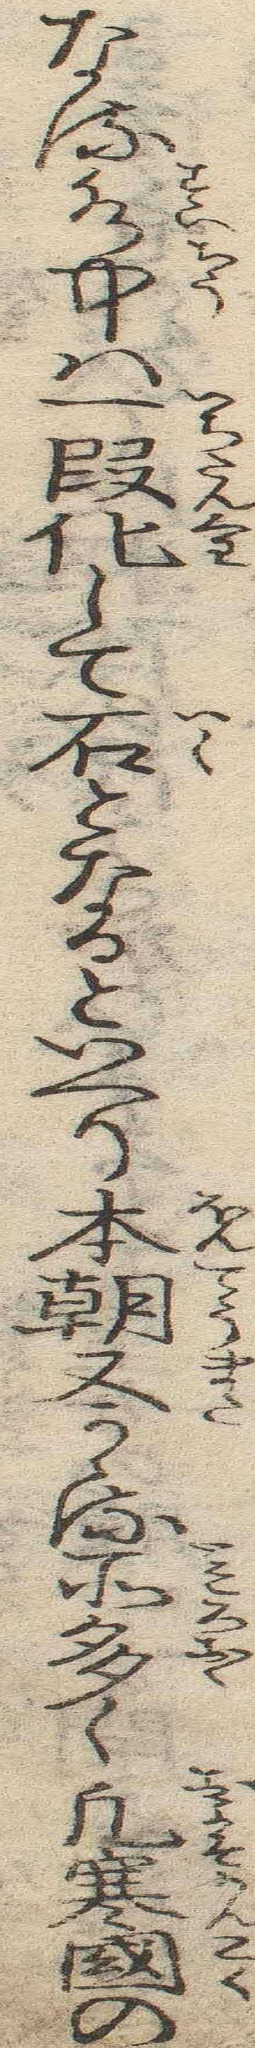なる水中は一叚化して石となるといへり本朝又かゝる所多く凡寒国の
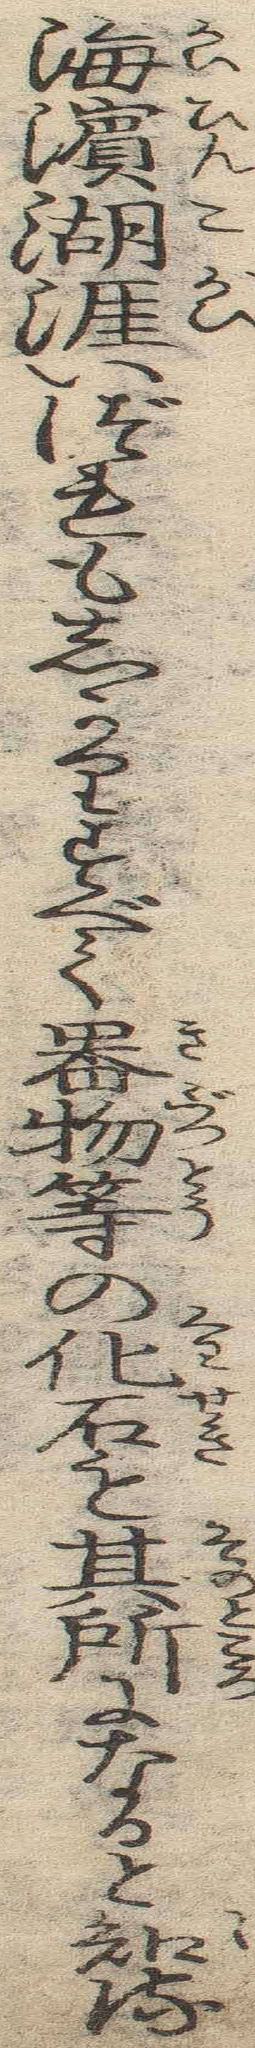海浜湖涯いずれもしかりすべて器物等の化石も其所になると知る
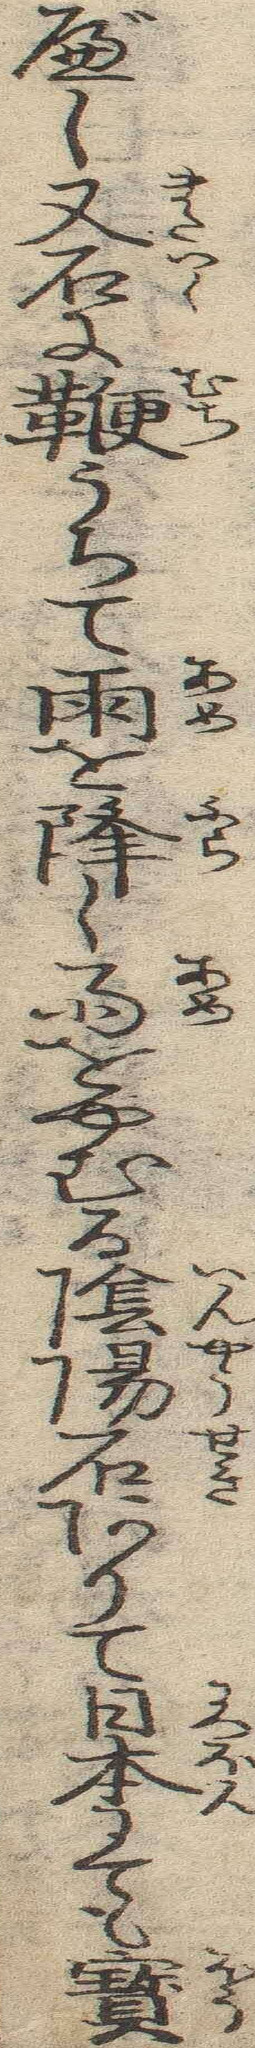べし又石に鞭うちて雨を降し雨をやむる陰陽石ありて日本にても宝

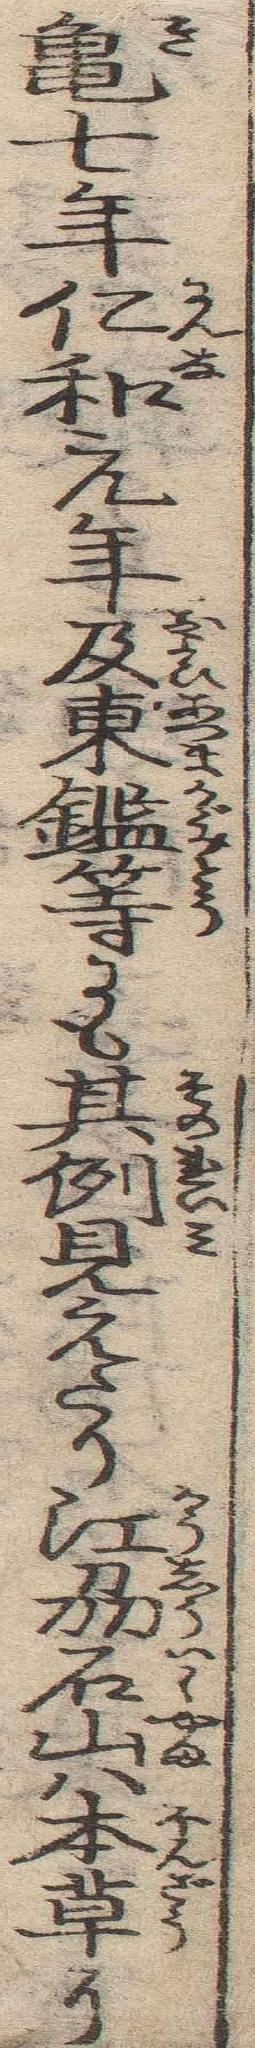亀七年仁和元年及東鑑等にも其例見えたり江州石山は本草に
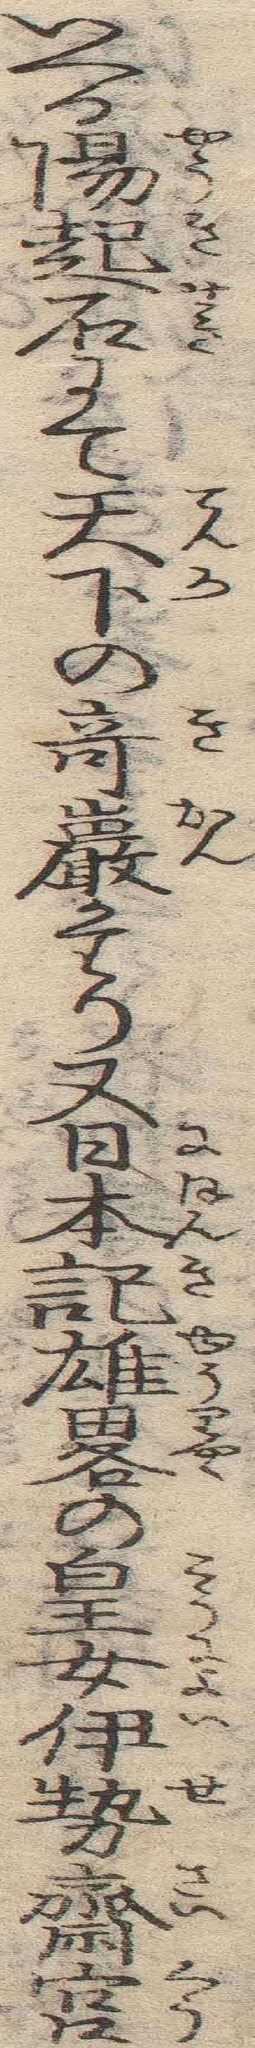いへる陽起石にて天下の奇巌たり又日本記雄略の皇女伊勢斎宮
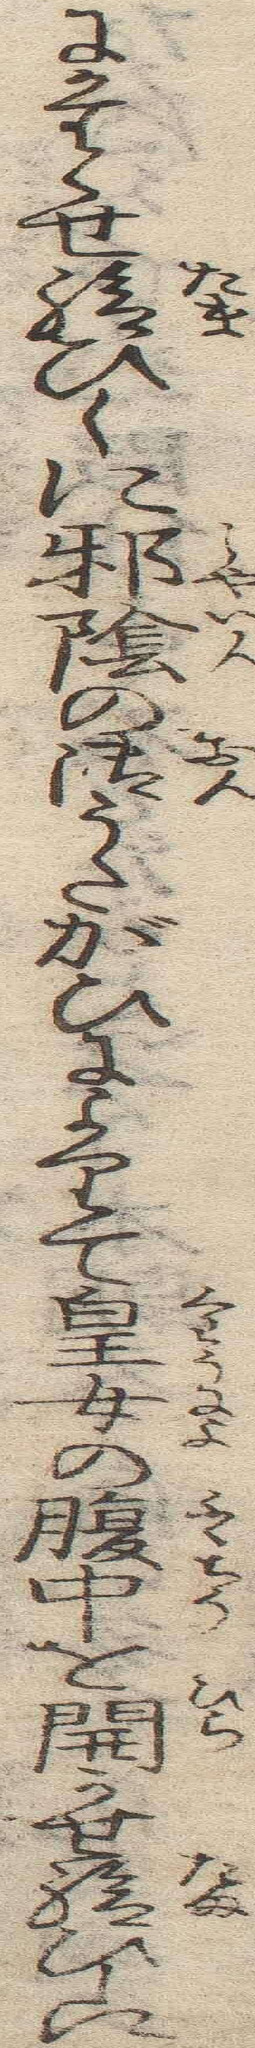にたゝせ給ひしに邪陰の御うたがひによりて皇女の腹中を開かせ給ひしに
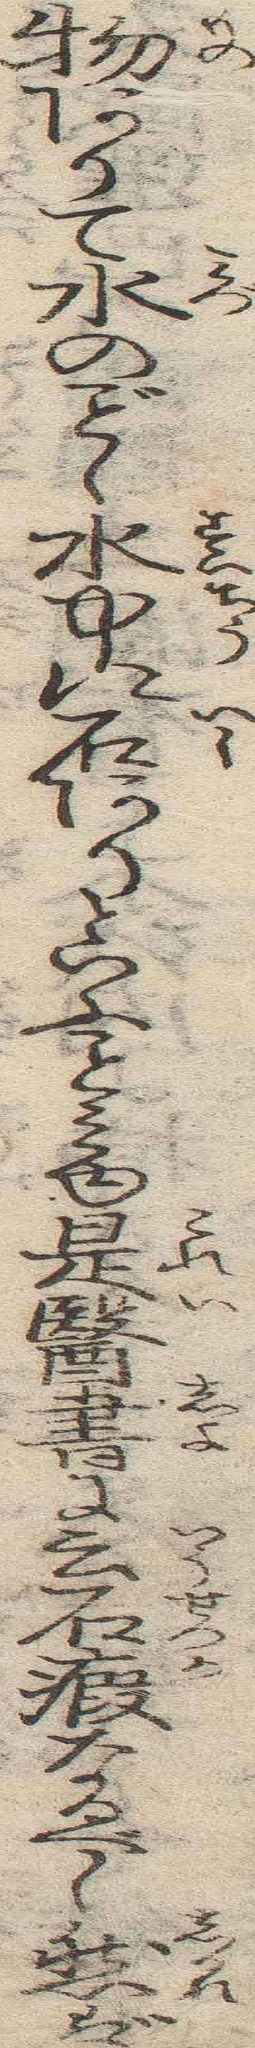物ありて水のごとし水中に石ありといふことみゆ是医書に云石瘕なるべし然ば
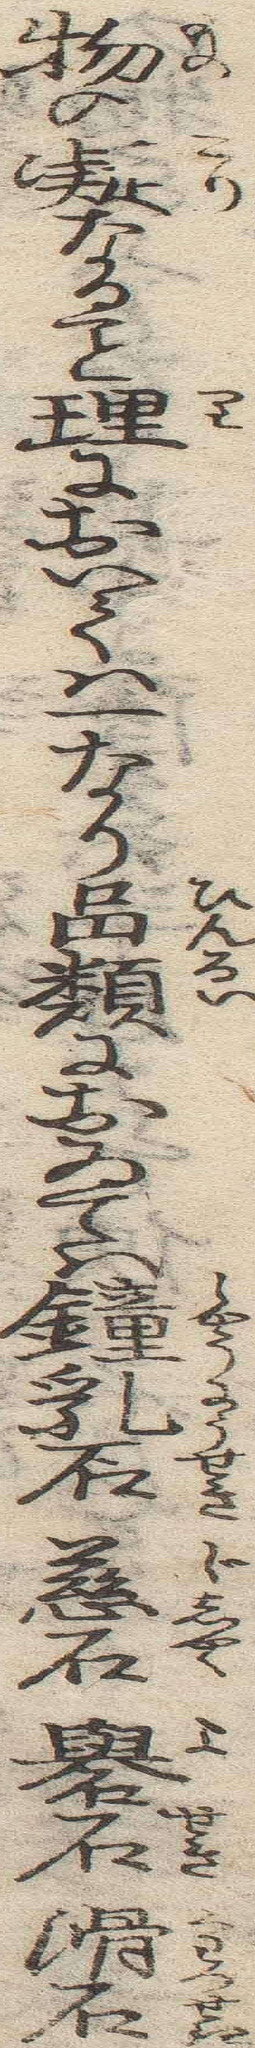物の凝なること理においては一なり品類におゐては鍾乳石慈石礜石滑石
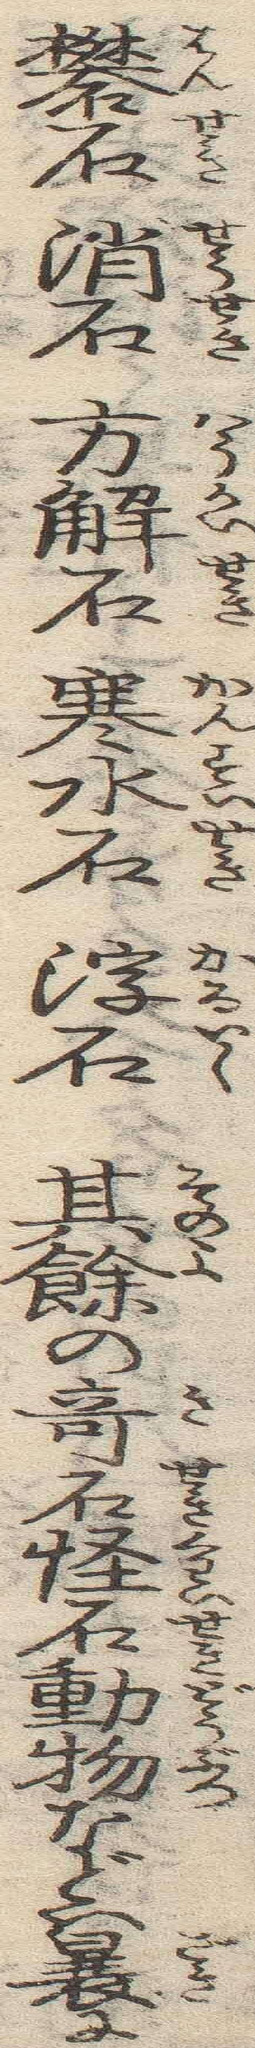礬石消石方解石寒水石浮石其余の奇石怪石動物などは曩に
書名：日本山海名産図会
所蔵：東京学芸大学附属図書館 国文学研究資料館
